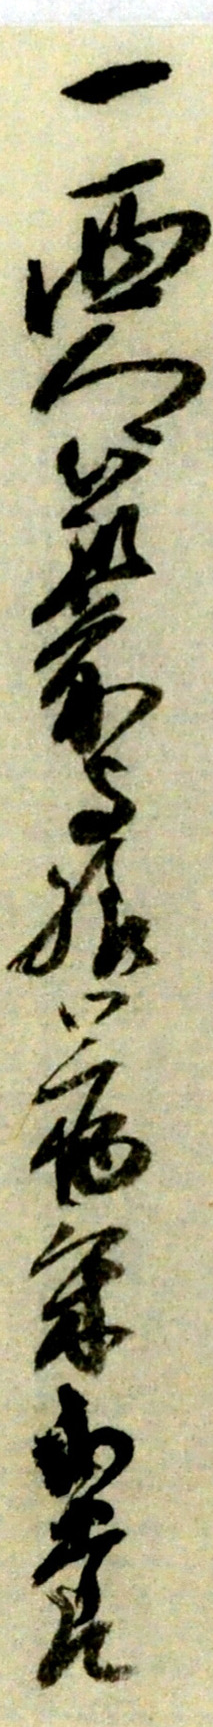一西郷筑前守様御病気御養
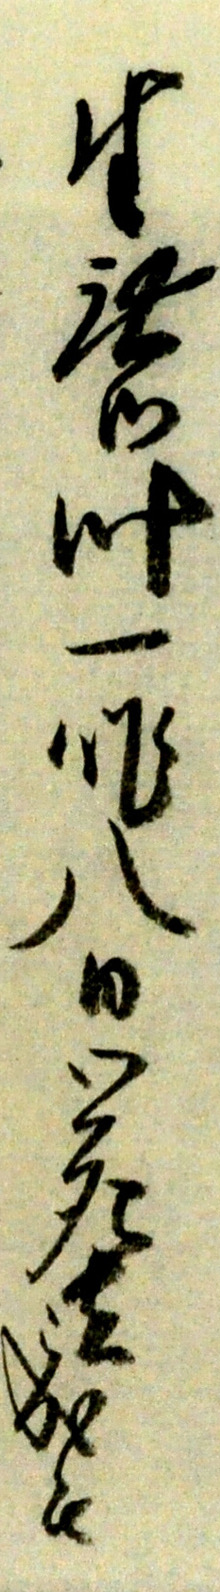生無御叶一昨八日御死去被成候由
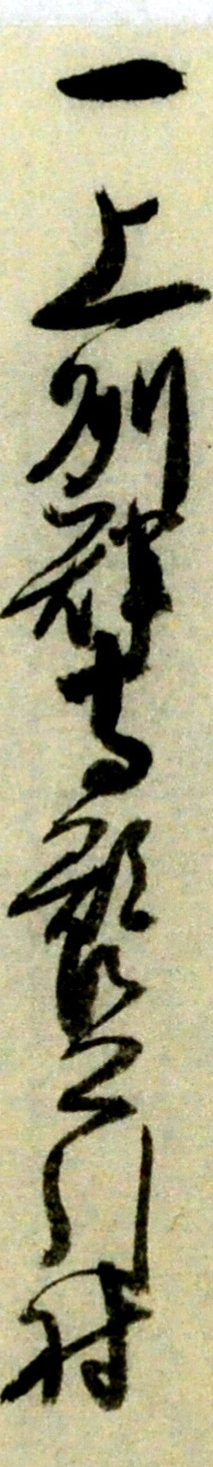一上州群馬郡足引村
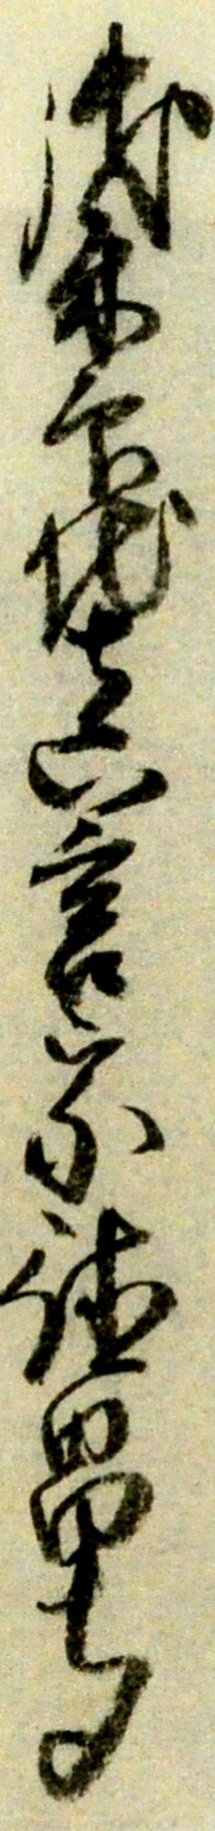御朱印地真言宗徳昌寺
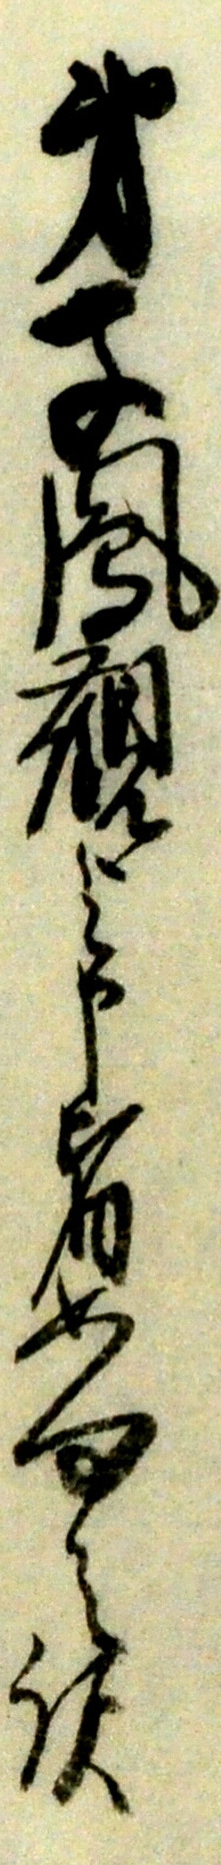弟子鳳寒と申者如何之訳
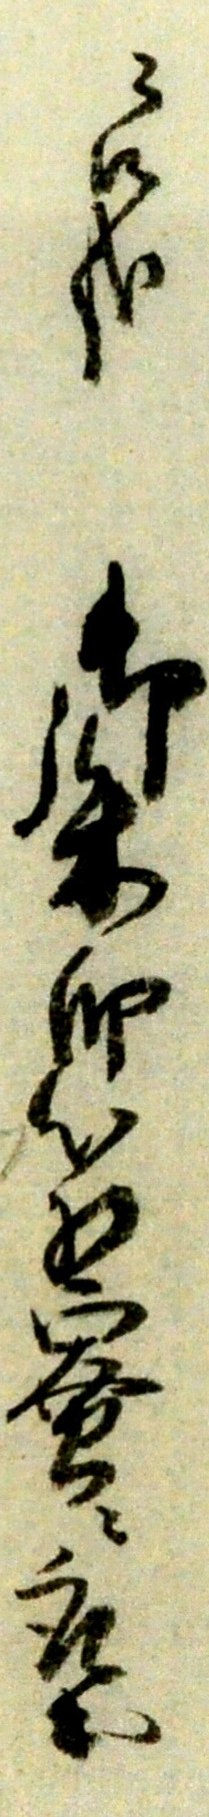に候哉御朱印箱蜜に取出
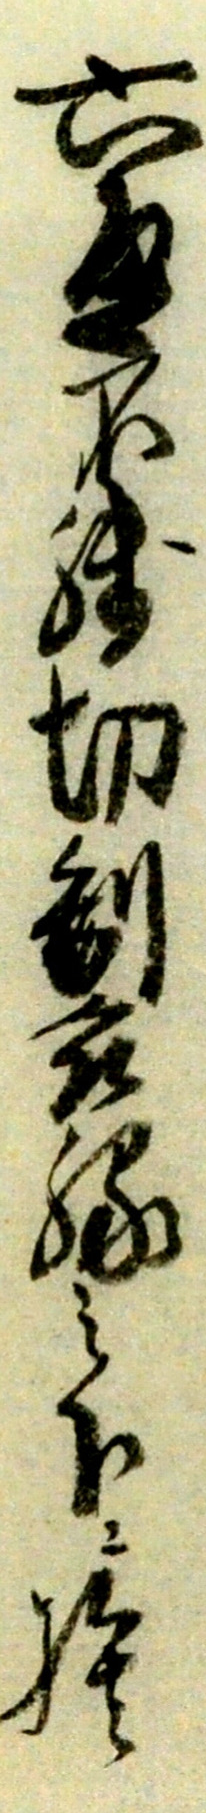六通不残切製縁之下に捨
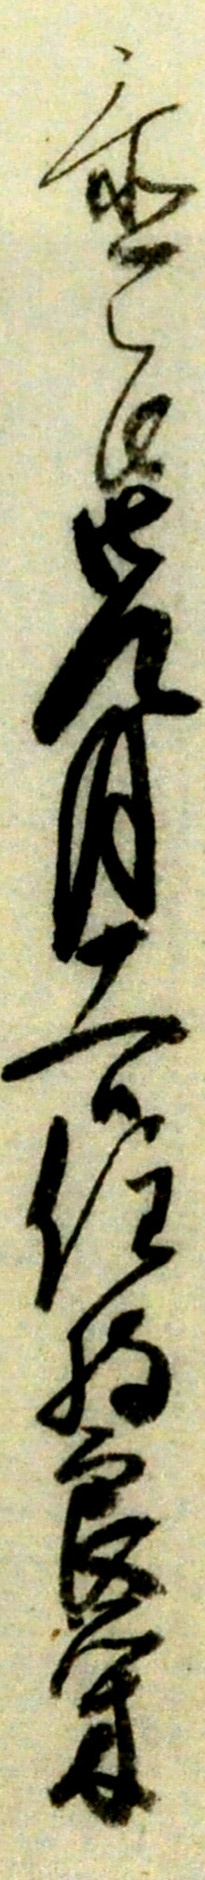置候由先月十一日住持良栄
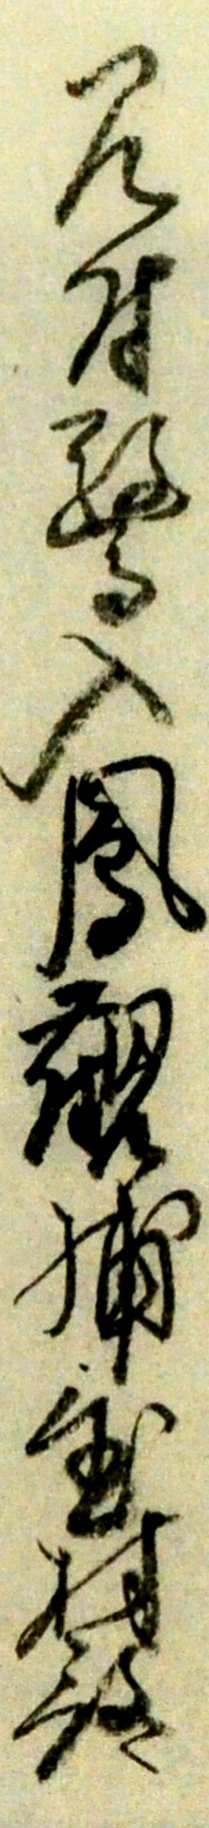見付驚入鳳観捕置村役へ
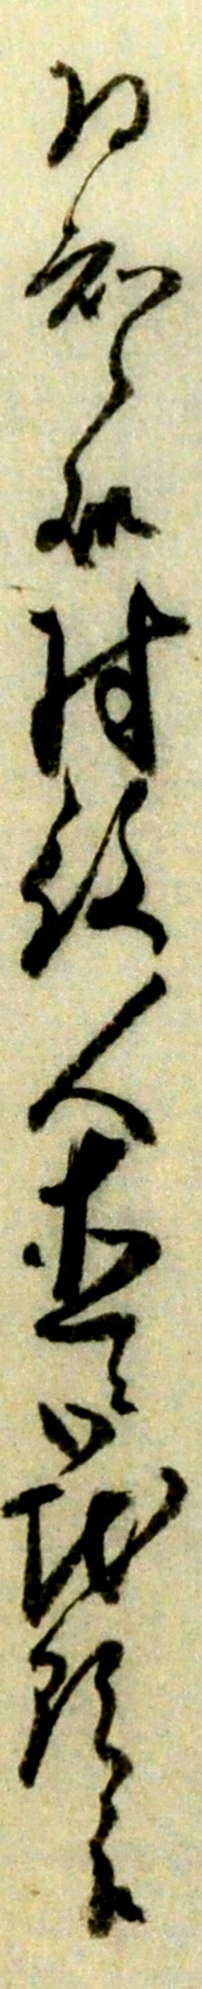為知候処村役人直に御地頭え
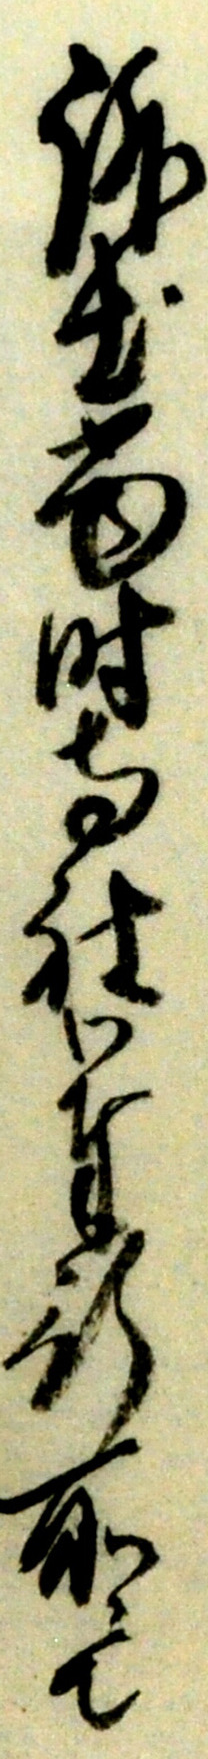訴出当時寺社御奉行所にて
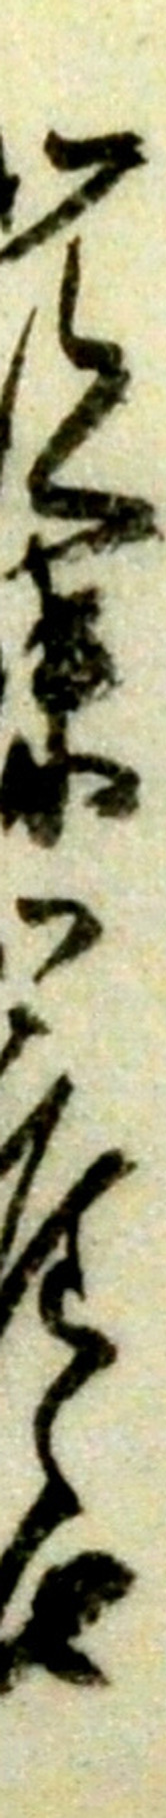御吟味御座候由

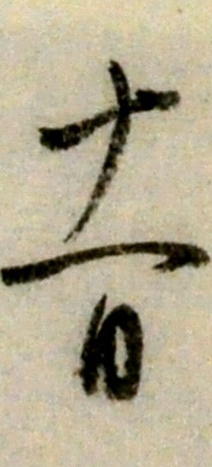十一日
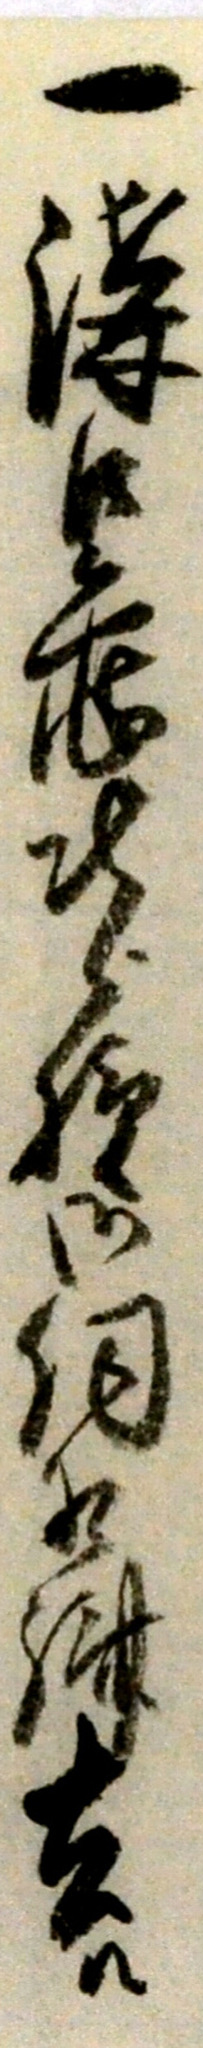一溝口亀次郎様御伺相済去ル
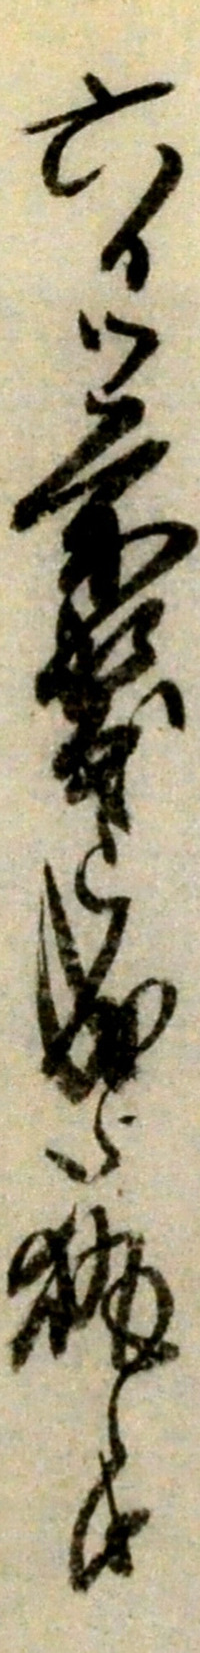六日御前髪被成御執候由
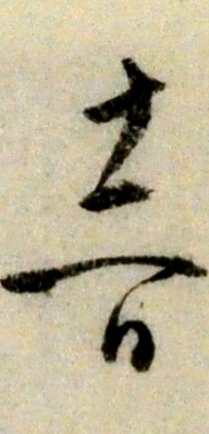十二日
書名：申合帳〔一括〕
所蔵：伊那市立高遠町図書館・合同会社AMANE
